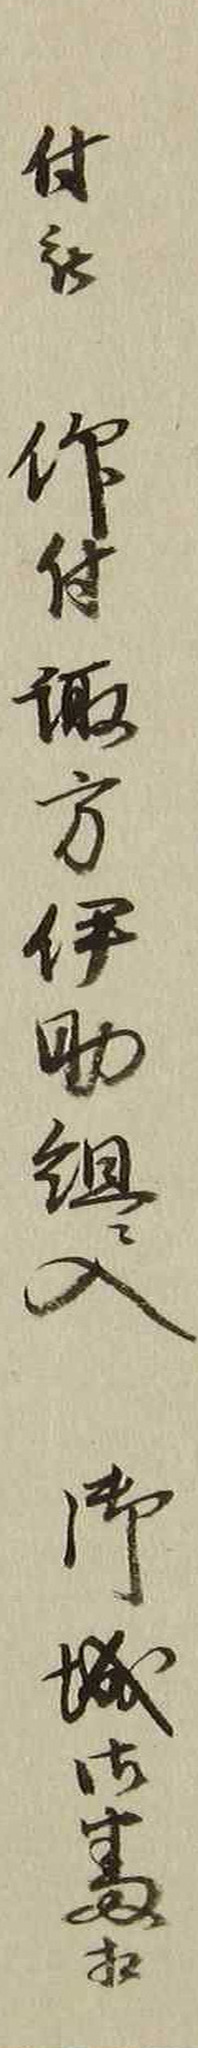付被仰付諏方伊助組ニ入御城御番相
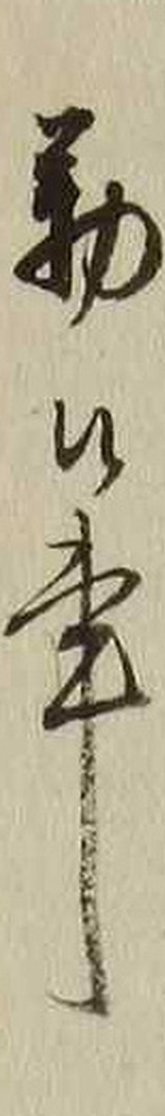勤候事
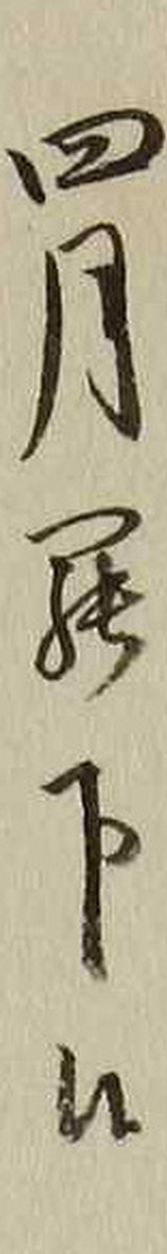四月罷下候
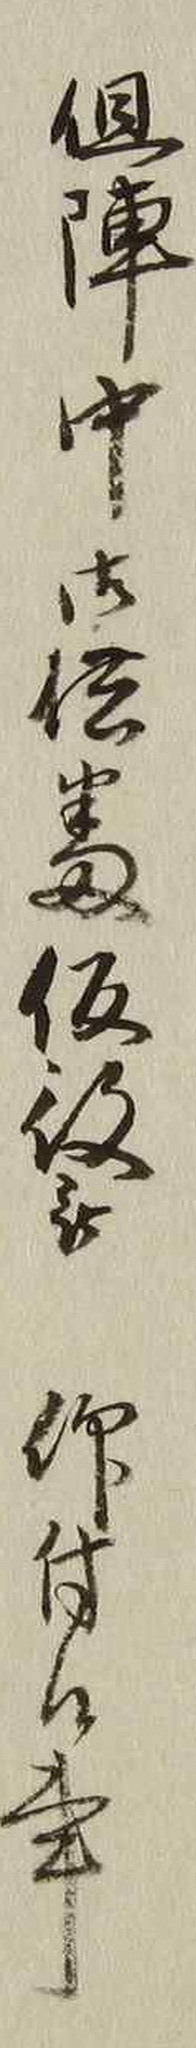但陣中御供番仮役被仰付候事
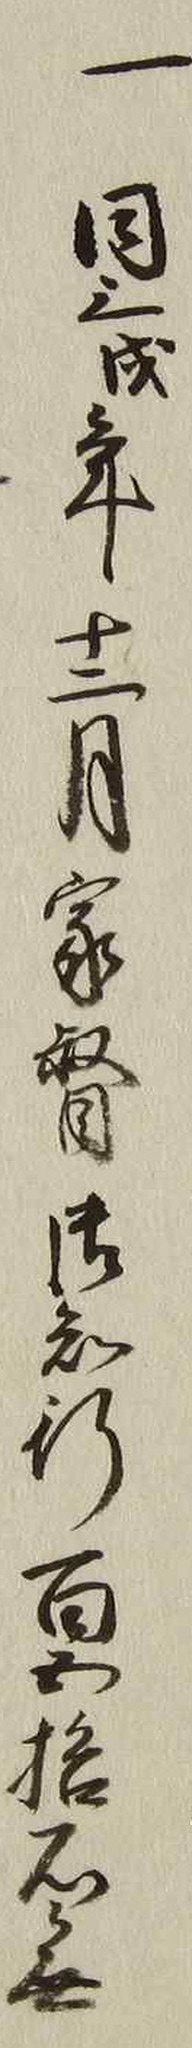一同三戌年十二月家督御知行百五拾石無
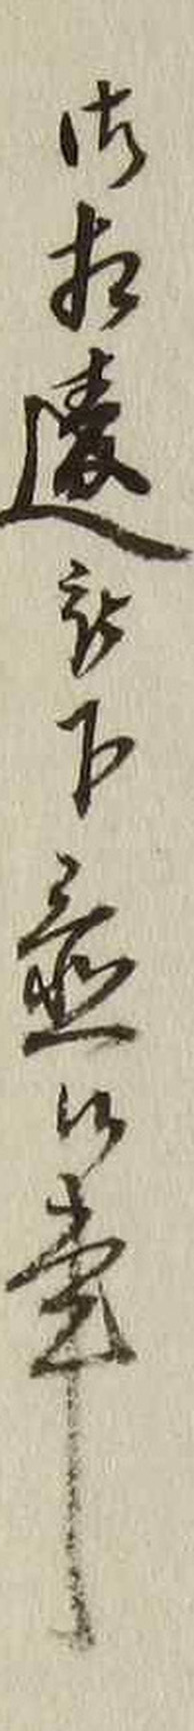御相違被下置候事
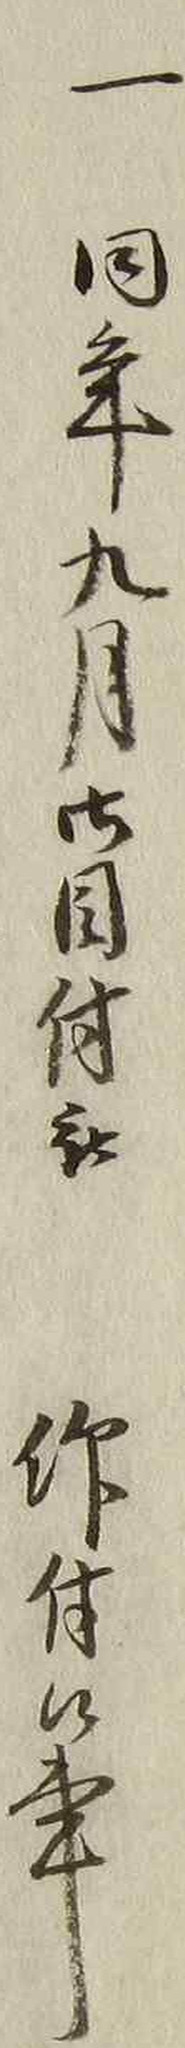一同年九月御目付被仰付候事
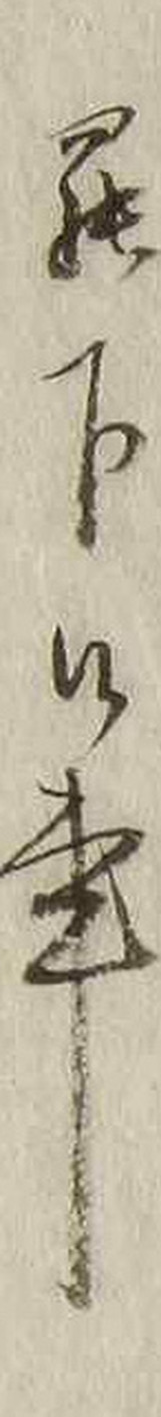罷下候事
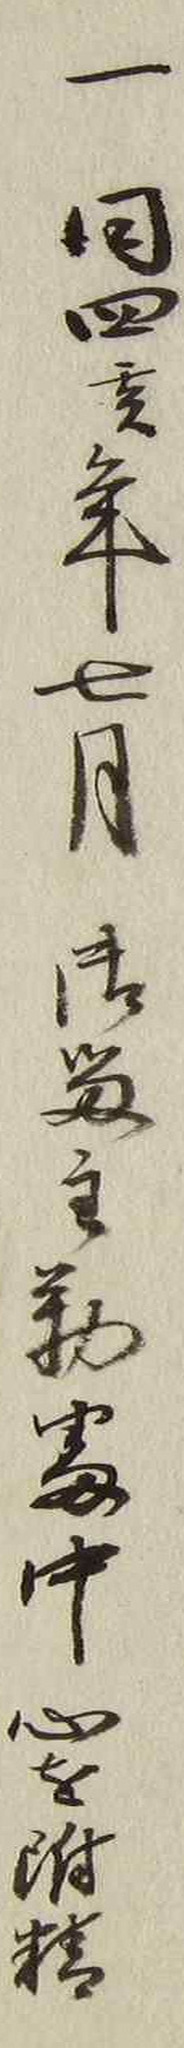一同四亥年七月御留主勤番中心を附精
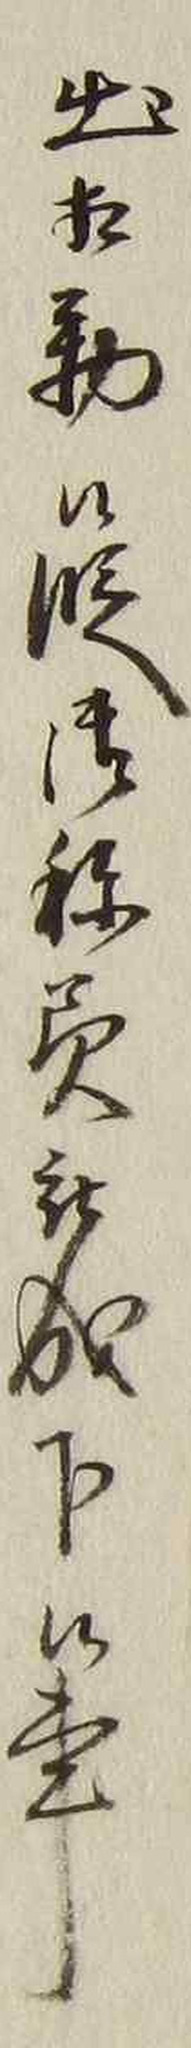出相勤候段御称美被成下候事
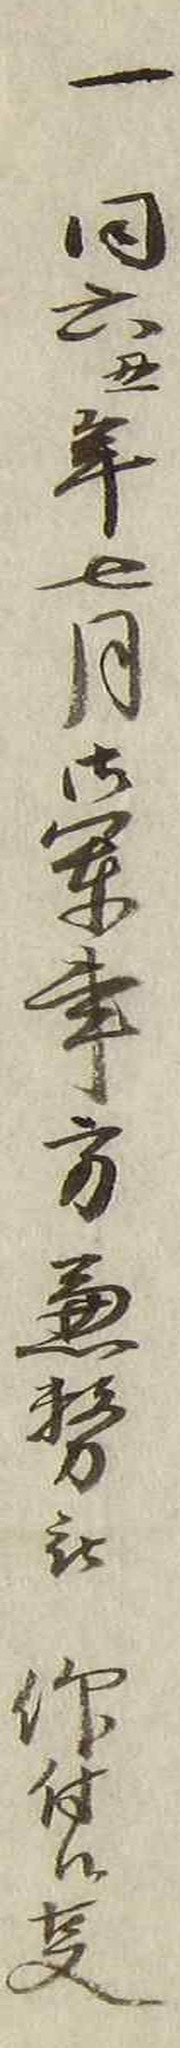一同六丑年七月御軍事方兼務被仰付候事
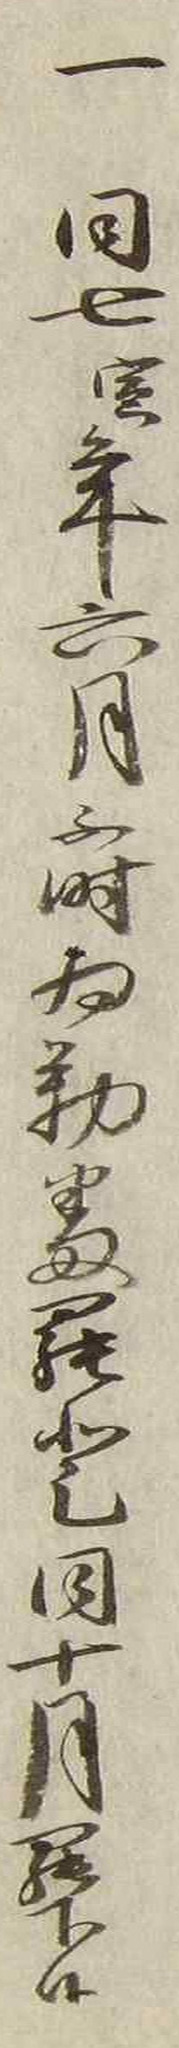一同七寅年六月不時為勤番罷登同十月罷下候

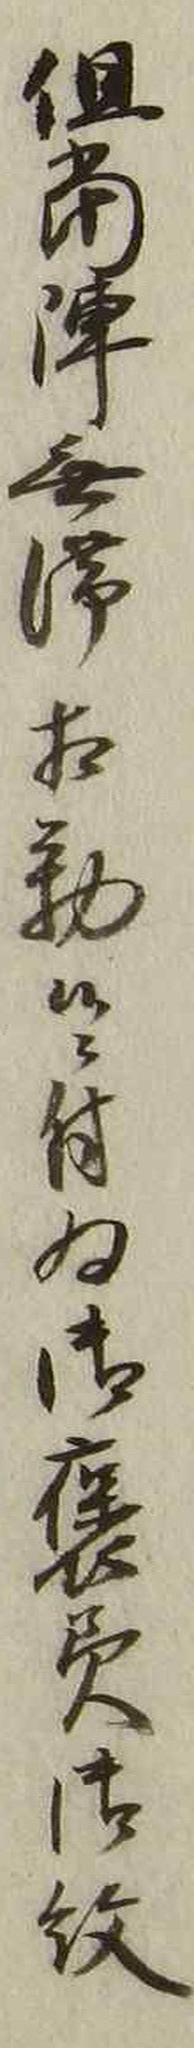但当陣無滞相勤候ニ付為御褒美御紋
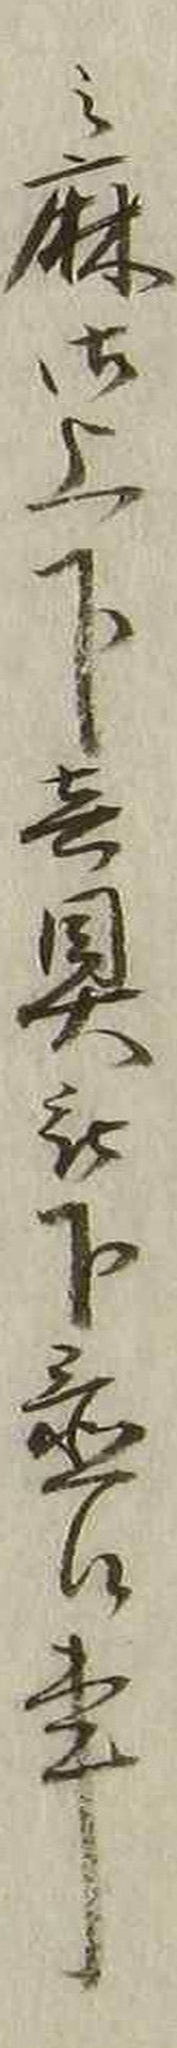之麻御上下壱具被下置候事
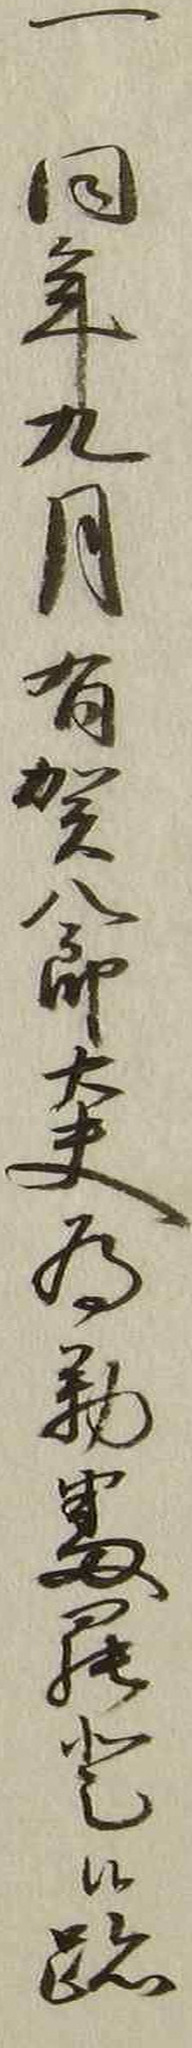一同年九月有賀八郎大夫為勤番罷登候跡
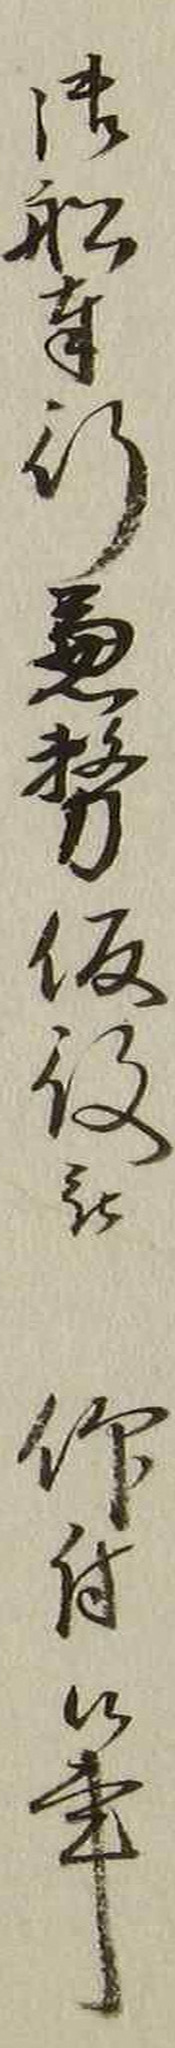御船奉行兼務仮役被仰付候事
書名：諸士系譜　巻之128　た之部4
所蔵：会津若松市立会津図書館
